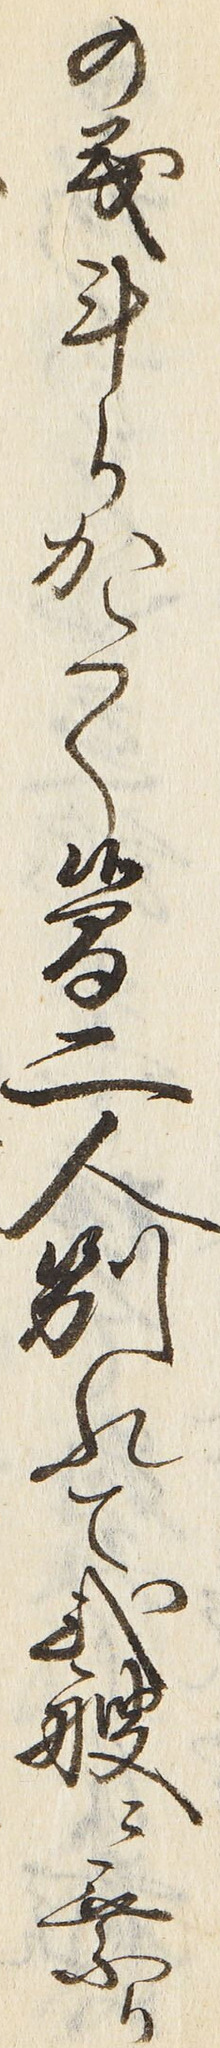の義とりかたく候間二人別れて弐艘ニ乗り
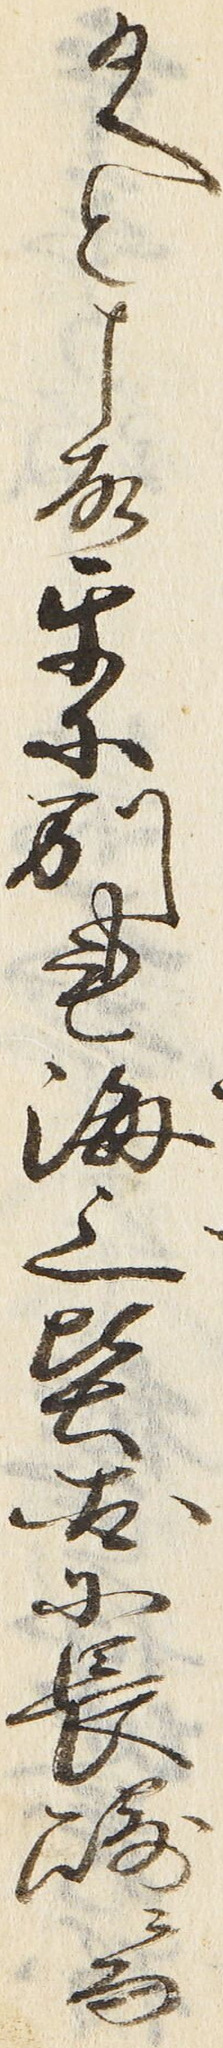給へと申故東に別れ海上堅固に長崎ニ而
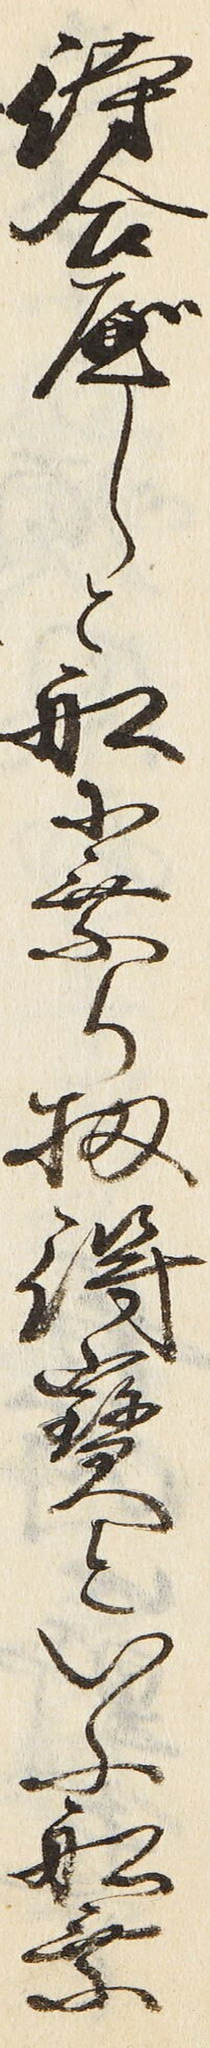待合べしと船に乗り扨得宝といふ船乗
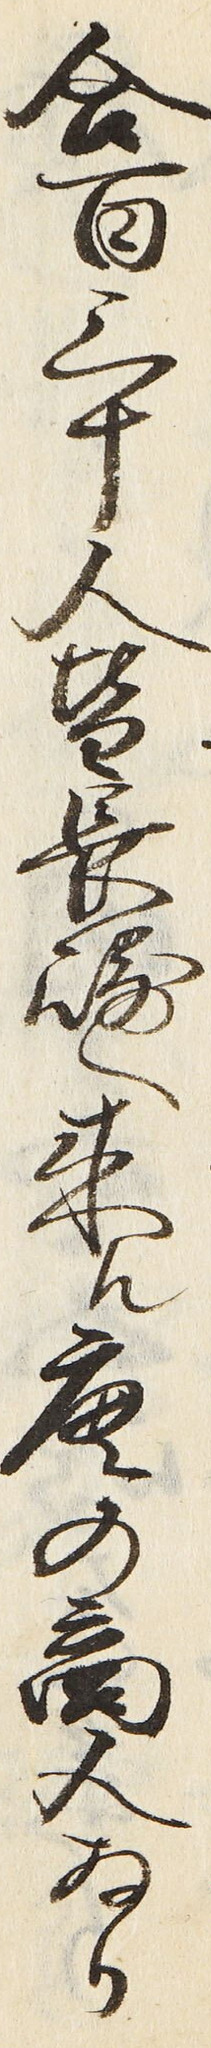合三十人皆長崎へ来ん唐の商人なり
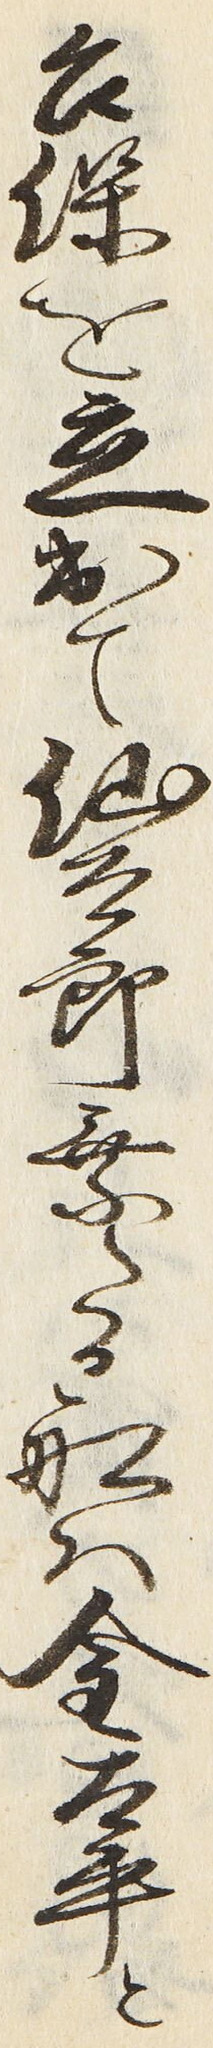台保を立出て仙太郎乗たる船ハ金太平と
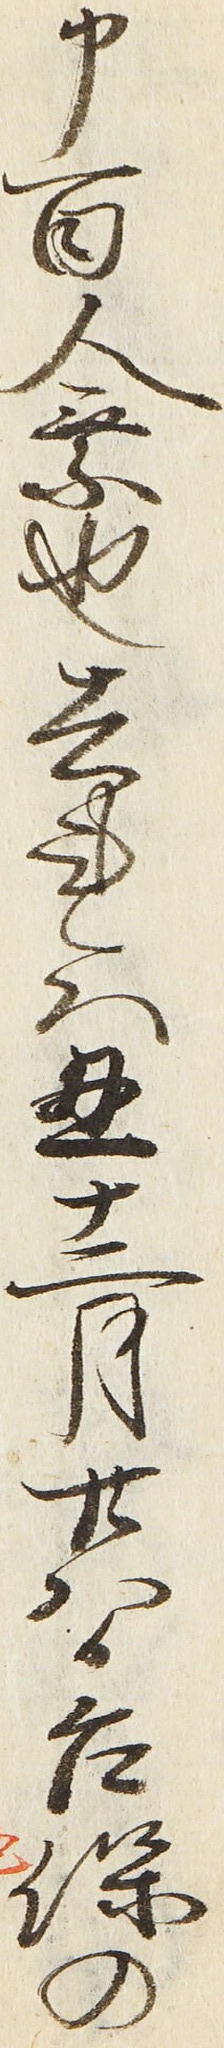申百人乗也されハ丑十二月廿八日台保の
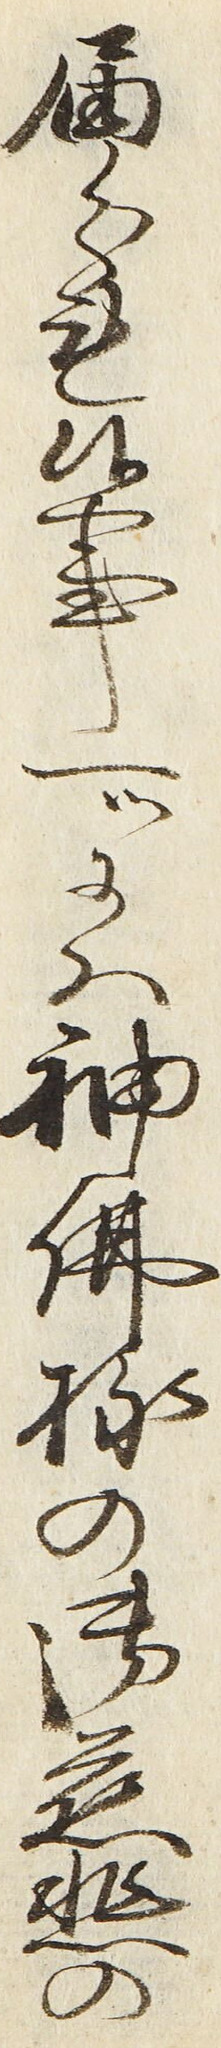届くれ候事一ッにハ神仏様の御慈悲の
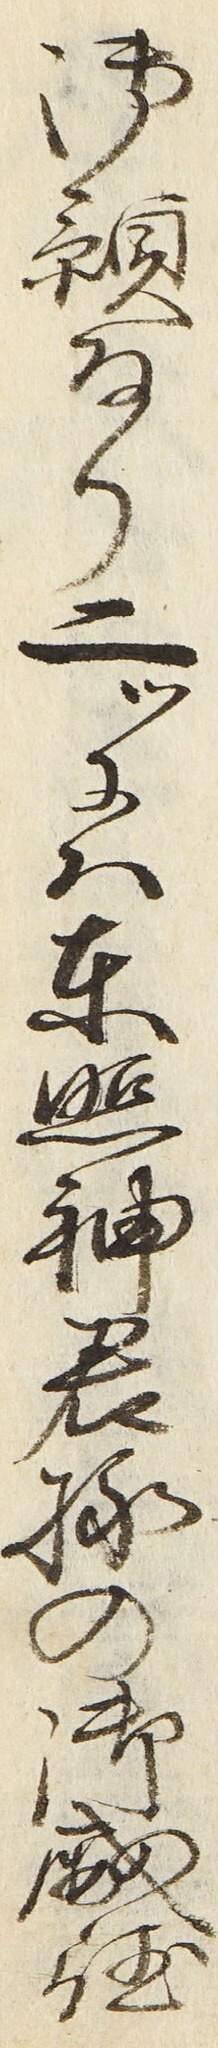御願なり二ッにハ東照神君様の御威徳

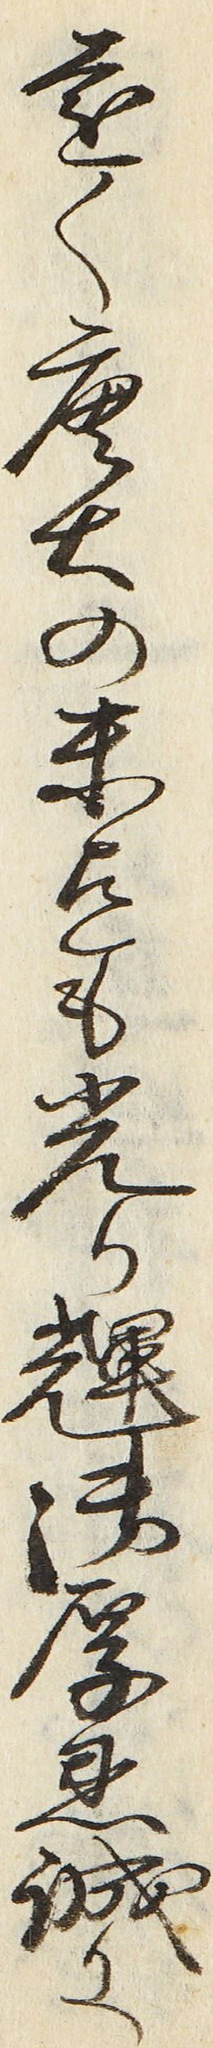遠く唐土の末迄も光輝御厚恩誠に
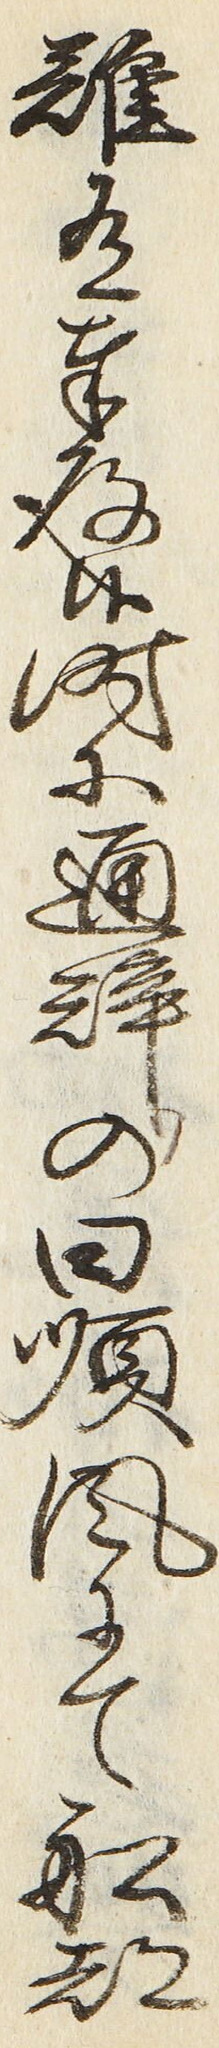難有奉存候時に通辞の日順風にて船都
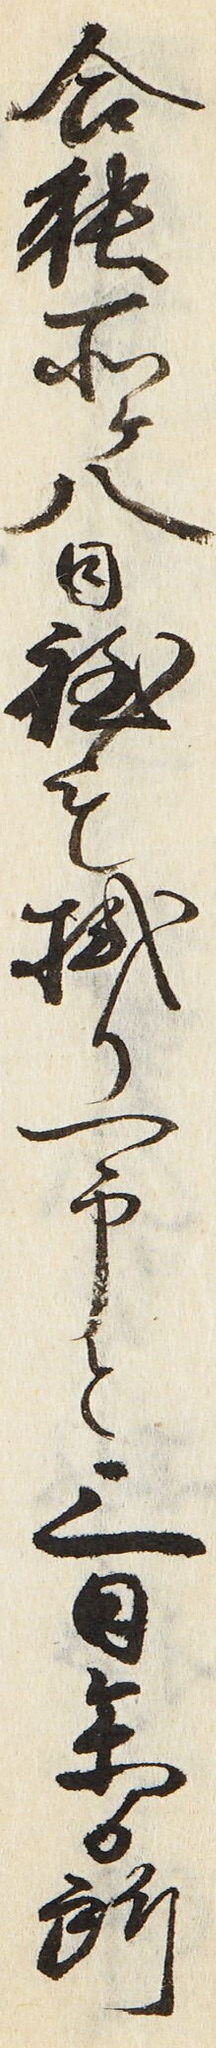合能所ヶ八日程も掛り可申も三日余る所
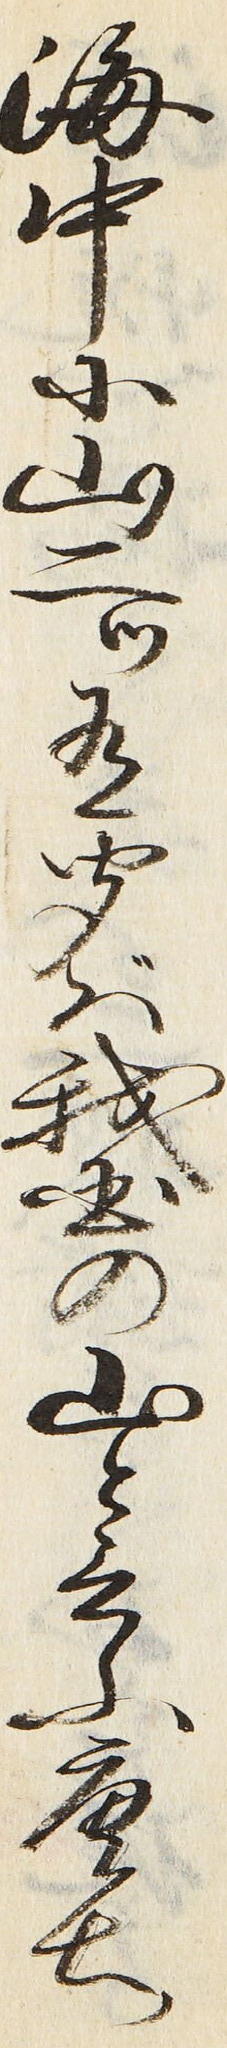海中小山二ッ有聞バ我国の山と云ふ唐土
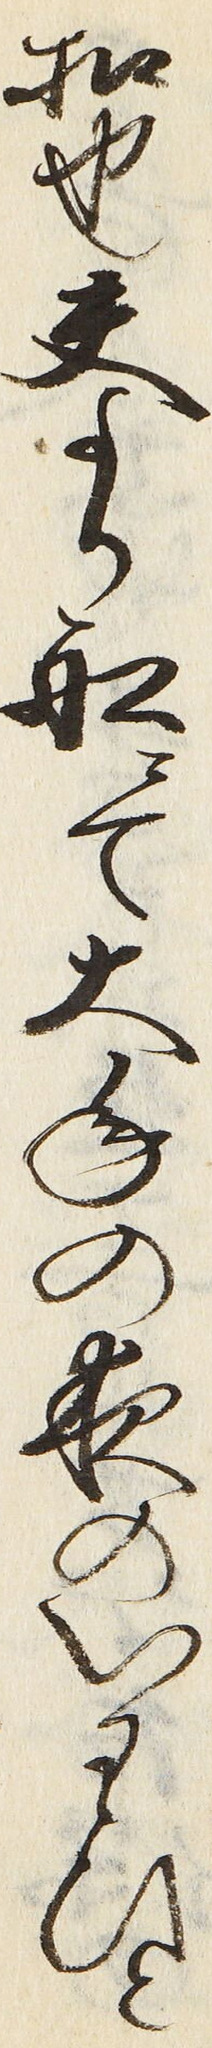扣也夫より船ニて大年の夜のいわひと
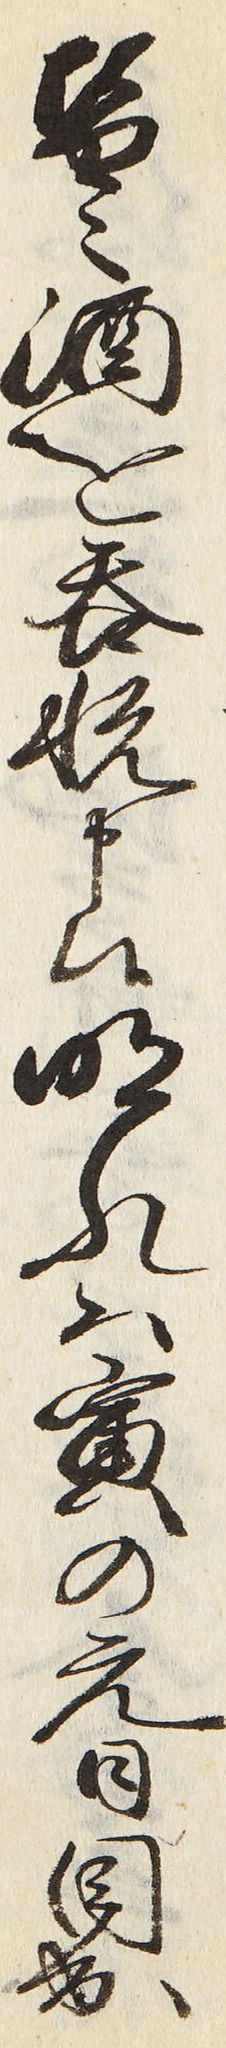皆々酒を呑祝申候明れハ寅の元日目出
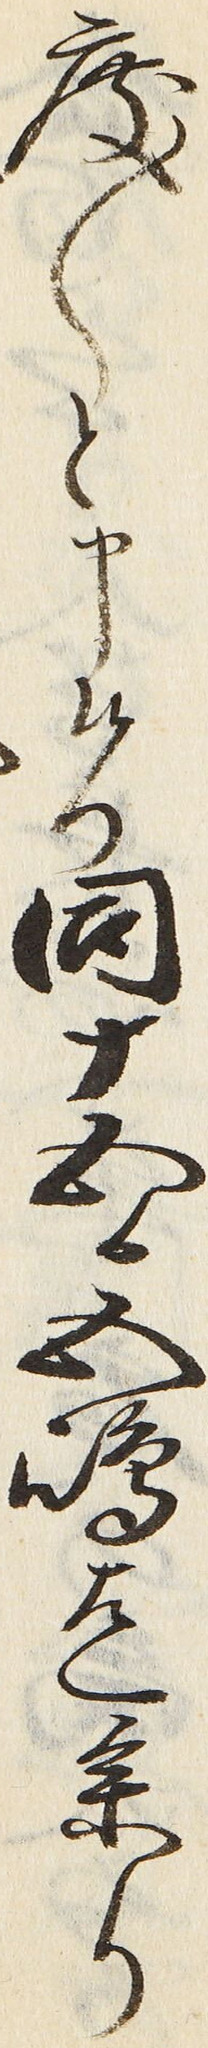度〳〵と申候か同十五日五嶋迄参り
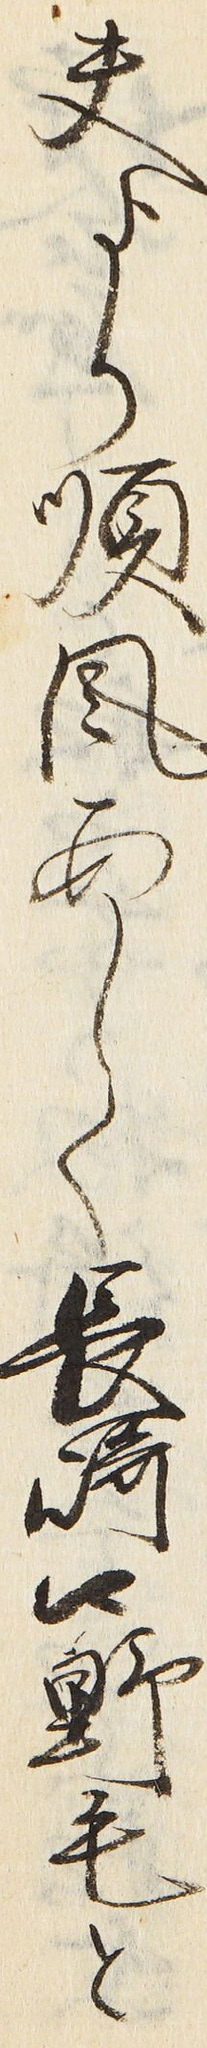夫より順風あしく長崎口野毛と
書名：天保漂流記
